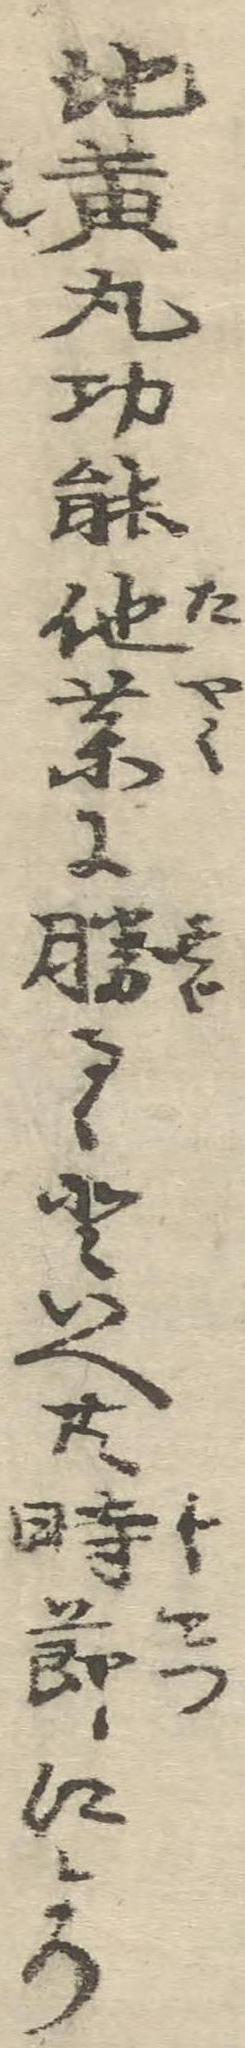地黄丸功能他薬に勝るゝといへ共時節により
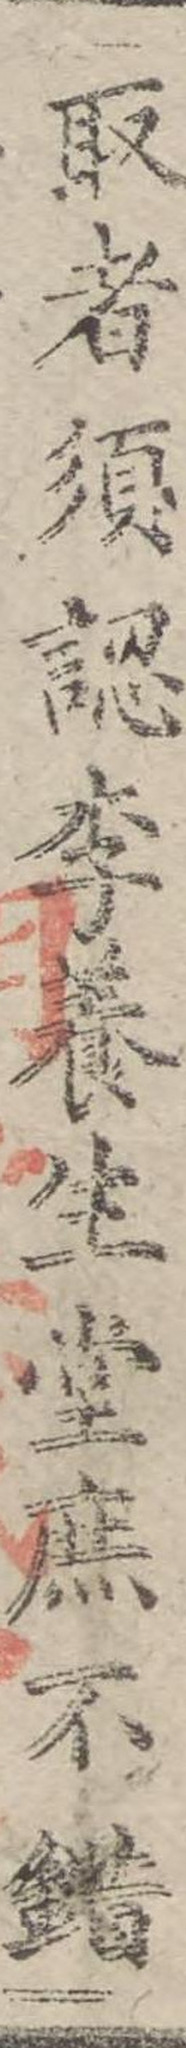取者須認李養生堂庶不錯
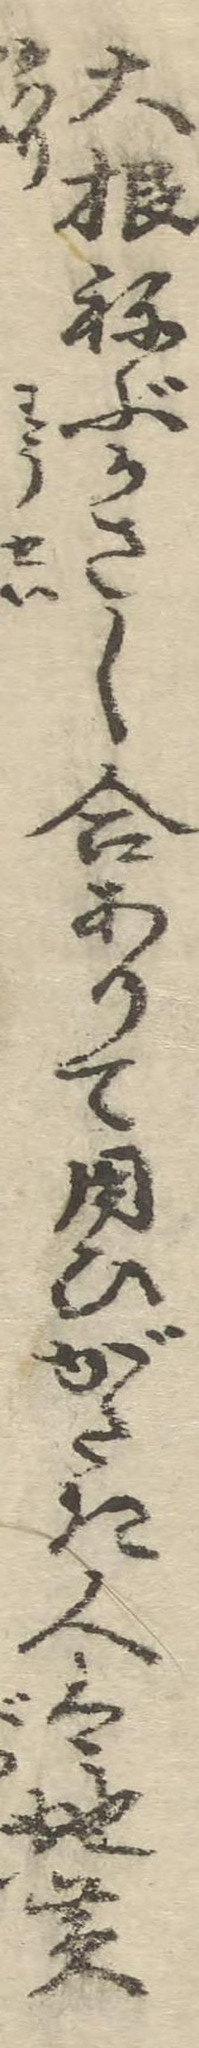大根ねぶかさし合ありて用ひがたき人は地黄
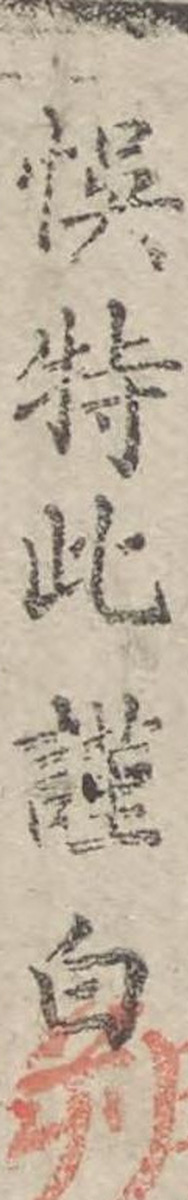悞特此謹白
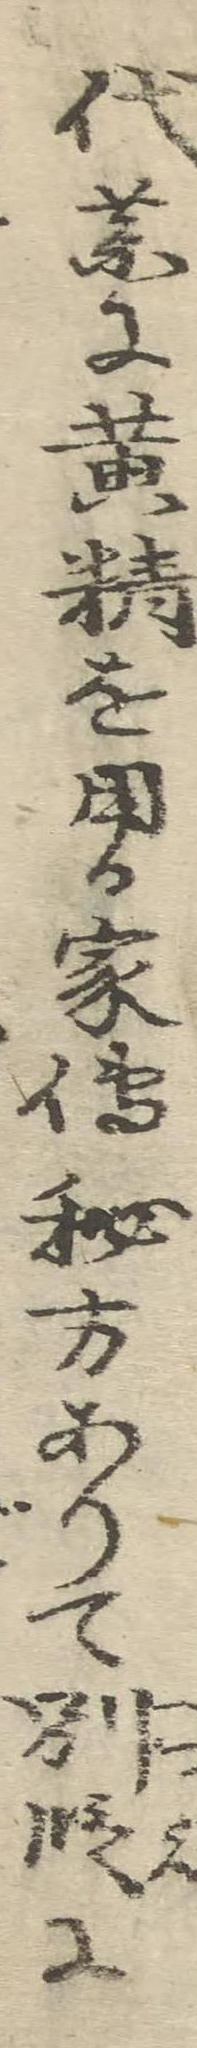代薬に黄精を用る家傳秘方ありて別段に
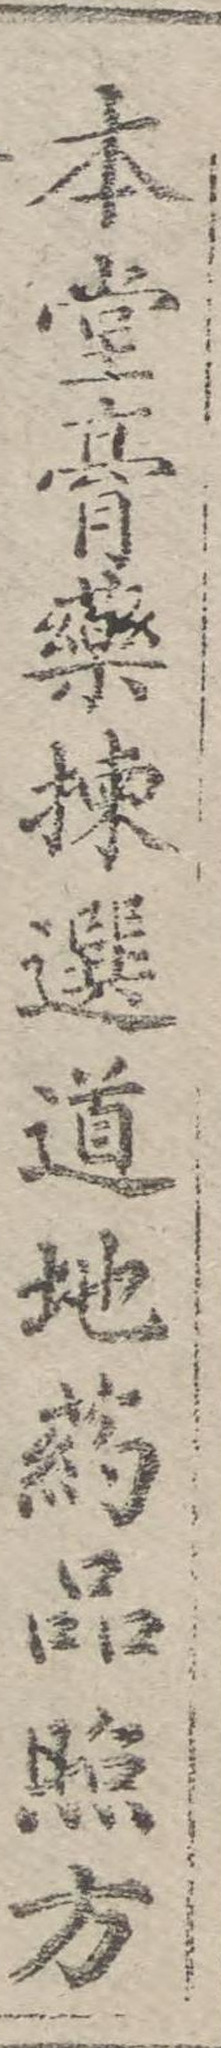本堂膏薬揀選道地葯品照方
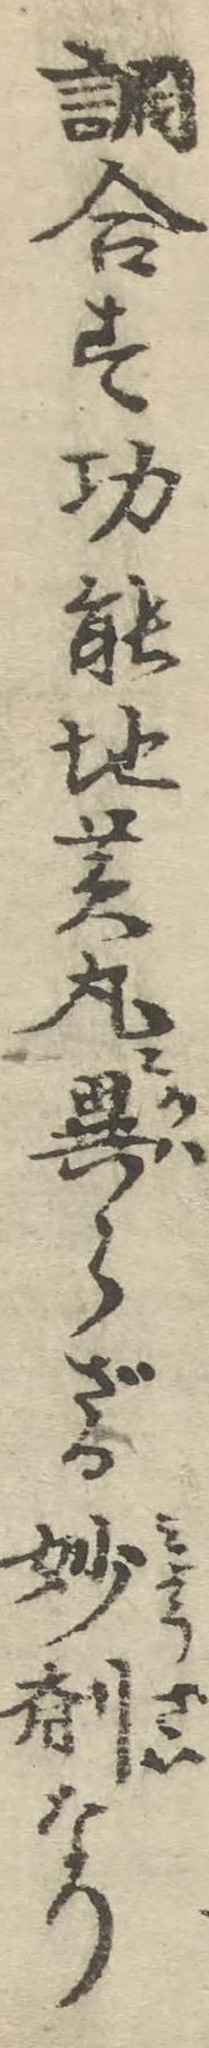調合す功能地黄丸に異らざる妙劑なり
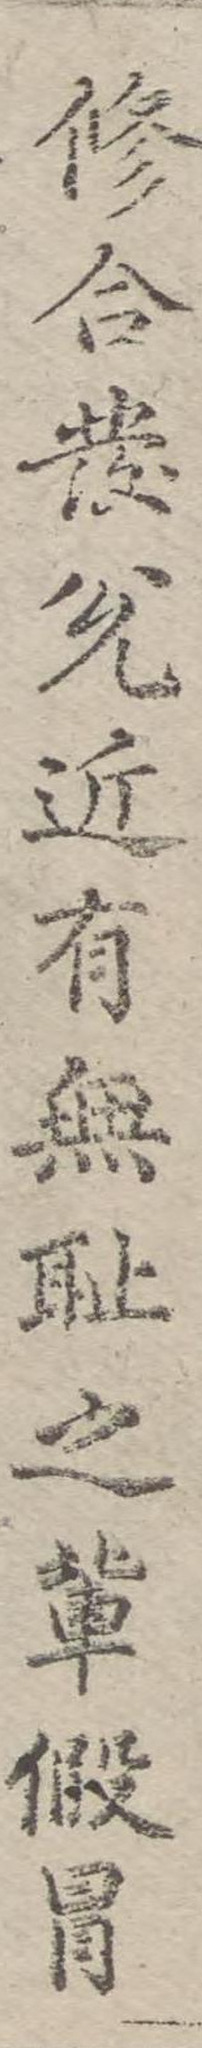修合発兌近有無耻之軰仮冐
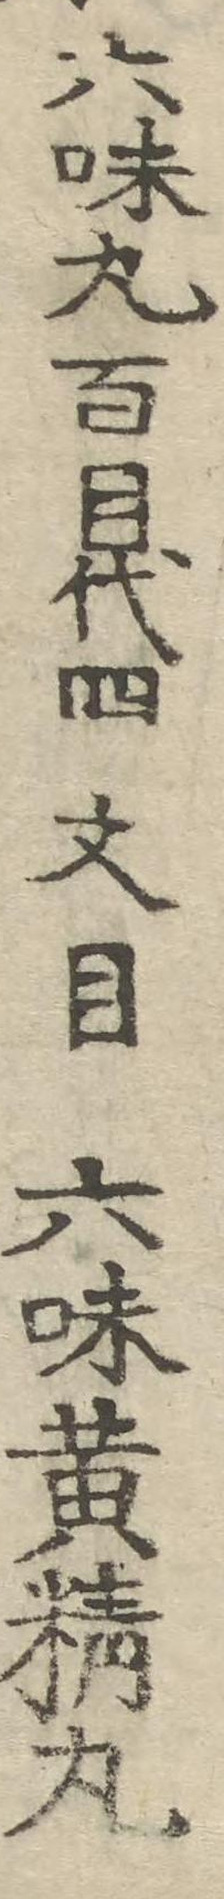価六味丸百目代四文目六味黄精丸
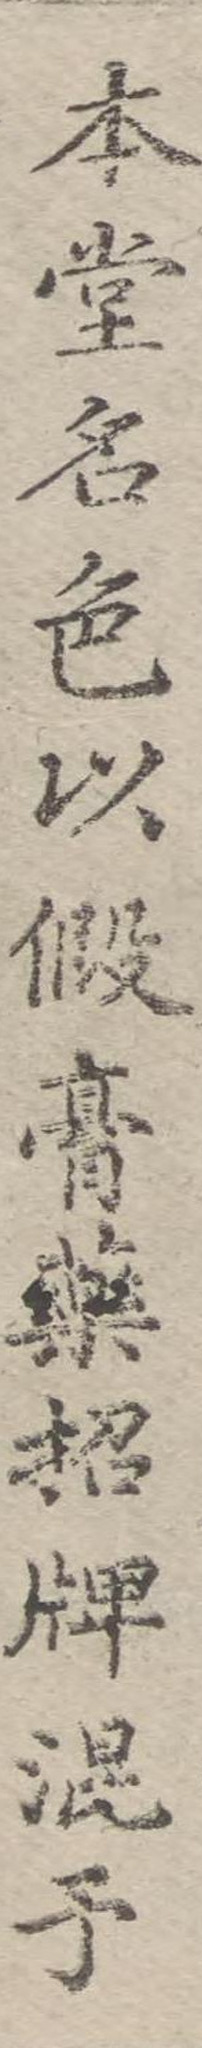本堂名色以仮膏薬招牌混予
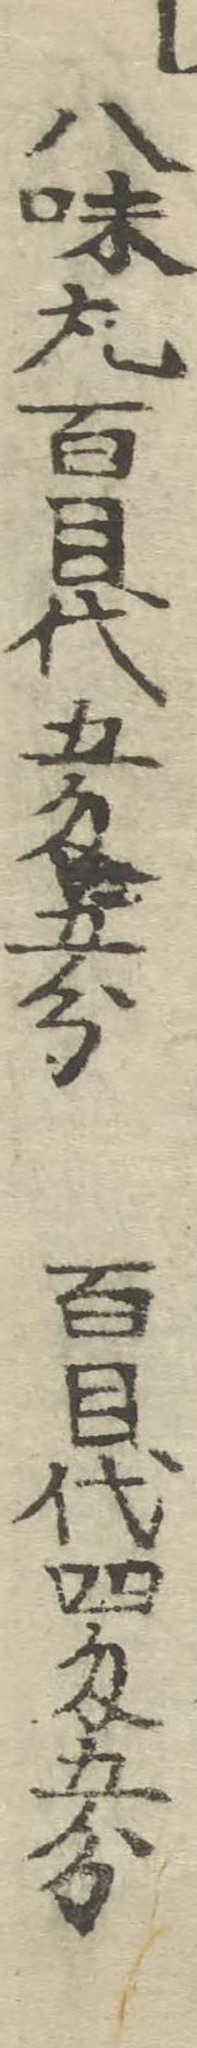八味丸百目代五匁五分百目代四匁五分
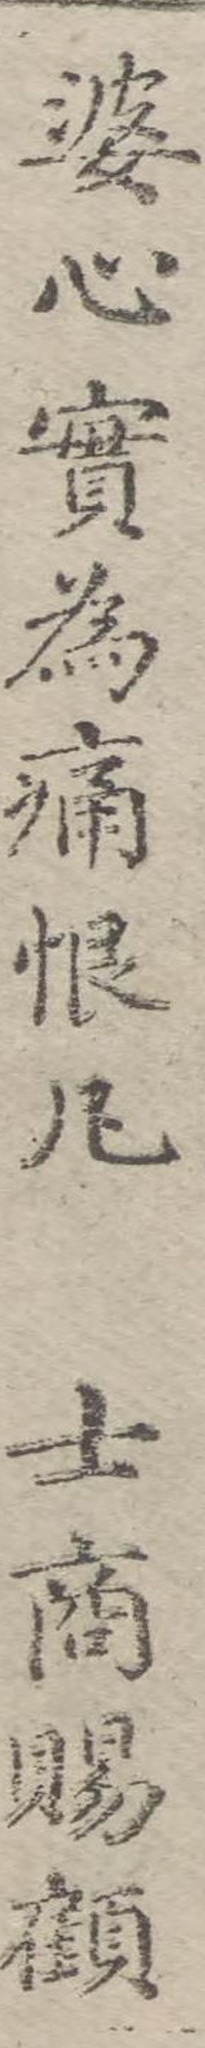婆心実為痛恨凡士商賜顧
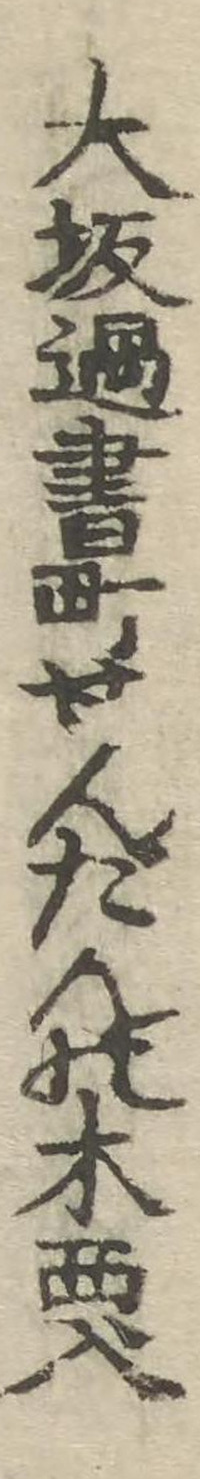大坂過書町せんだんの木西へ入
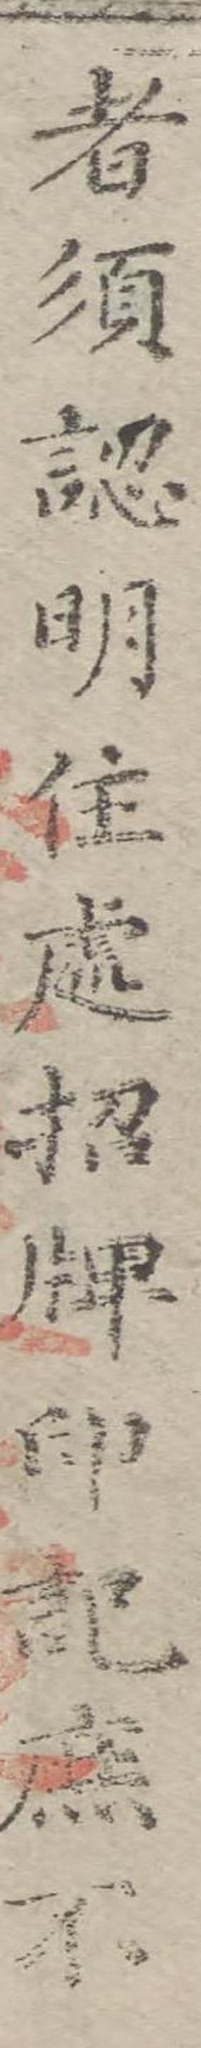者須認明住處招牌印記庶不
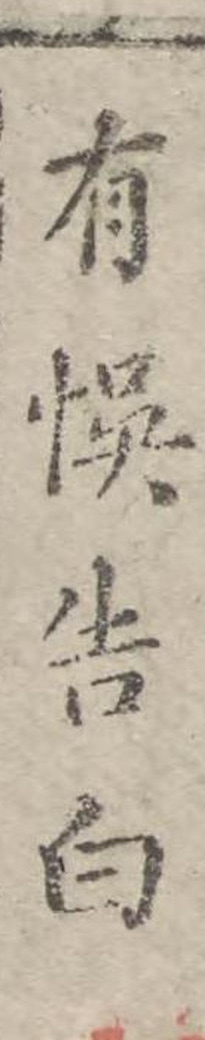有悞告白

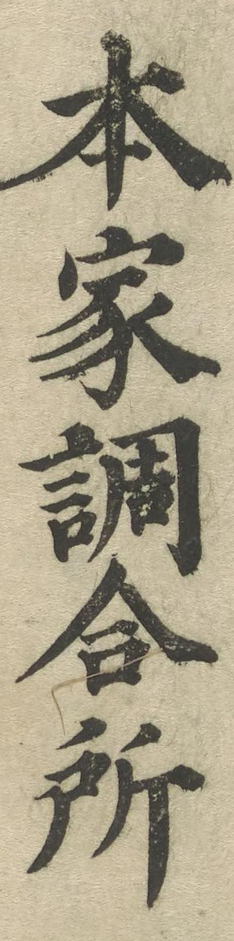本家調合所
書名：浪華薬種問屋能書張交帖. 二
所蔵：国立国会図書館 National Diet Library, JAPAN
